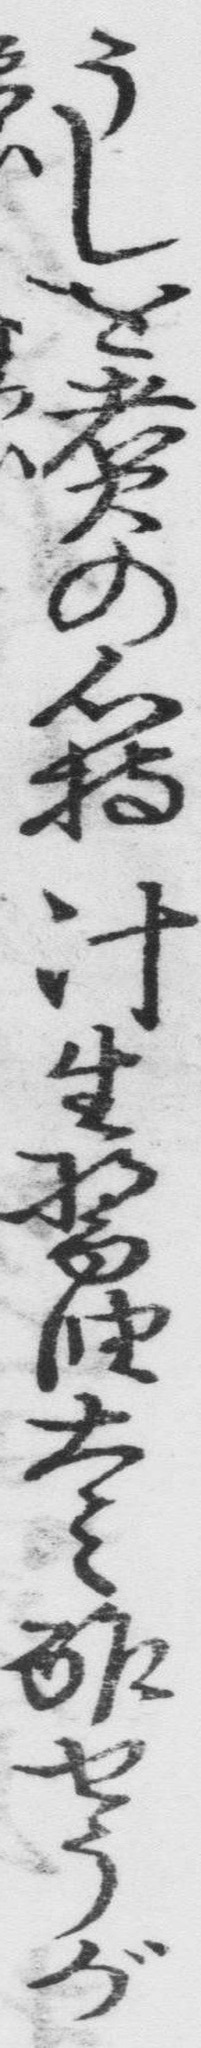うしを煮の心持汁生醤油大み酢せうが
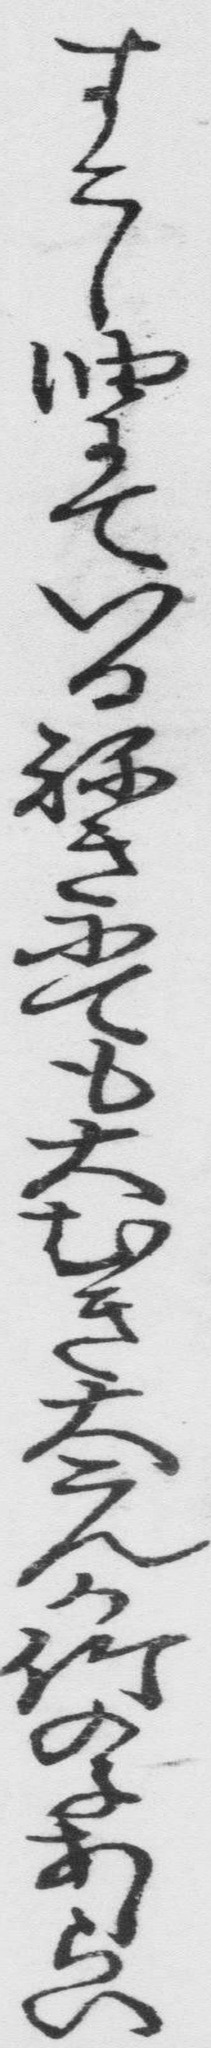すこし油尓ている祢き尓ても大むき大こんか竹の子あらい
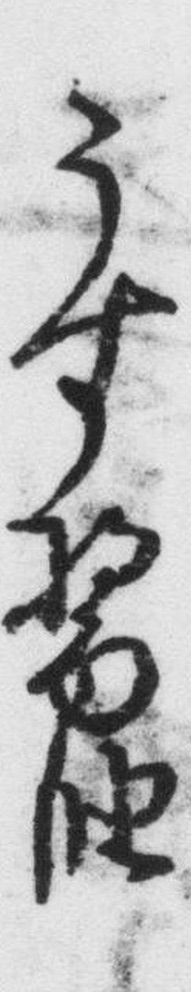うす醤油
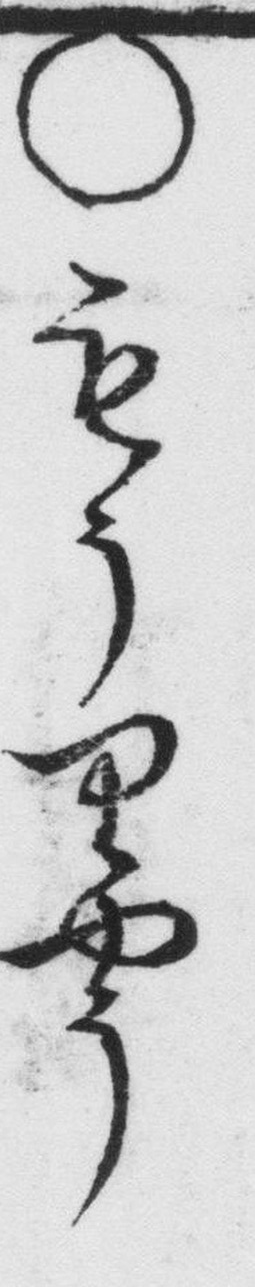〇もう里やう
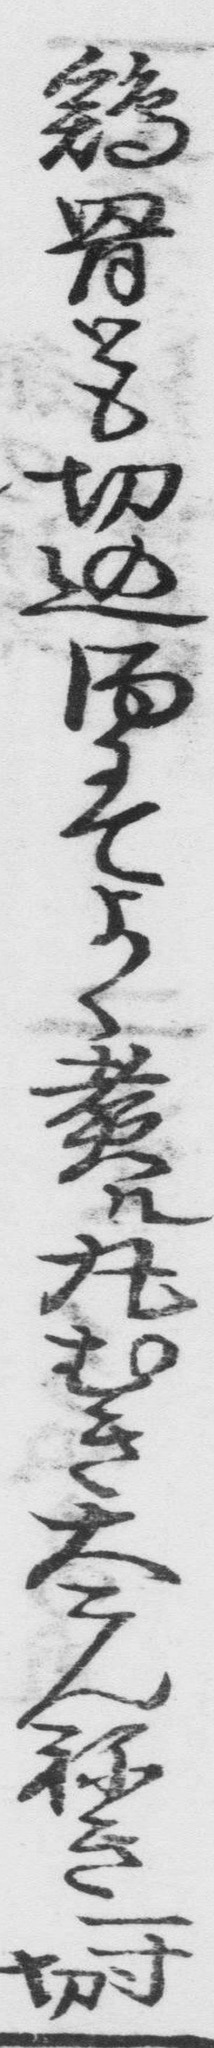鶏骨とも切込酒尓てよく煮る丸むき大こん祢き一寸切
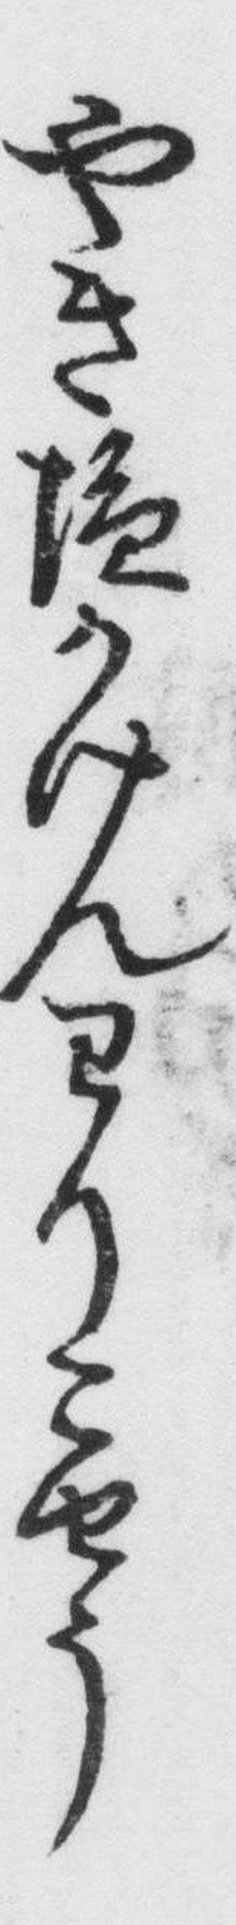やき塩かけんわりこせう

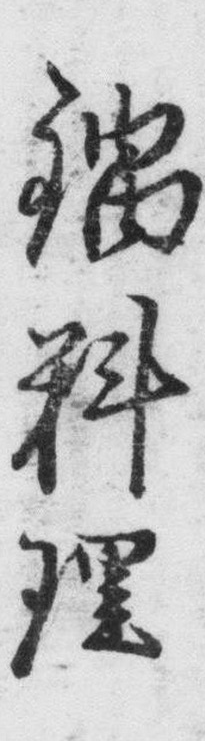鍋料理
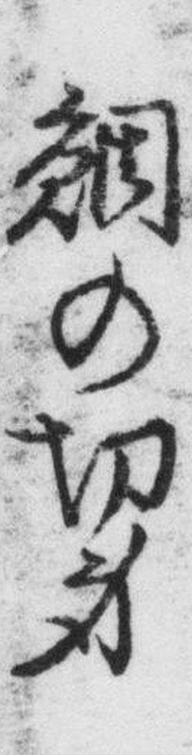鯛の切身
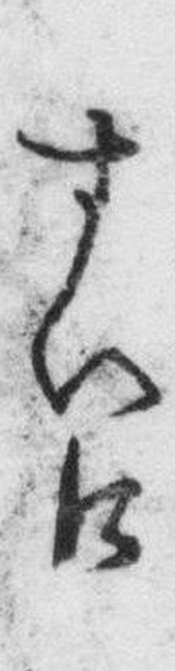すい口
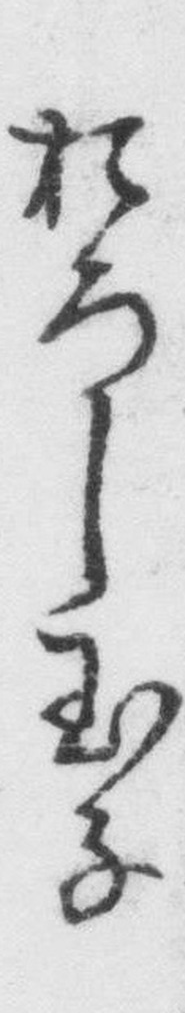於ろし玉子
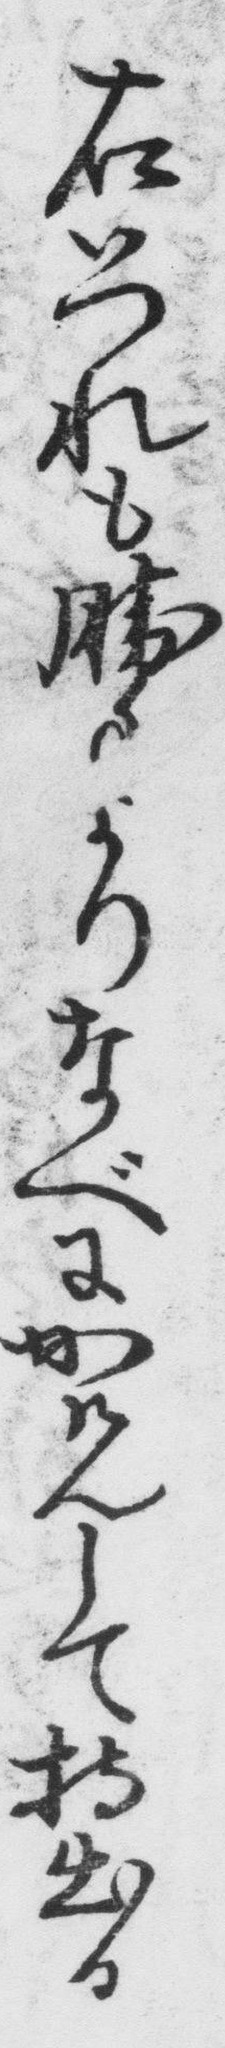右いつれも勝手よりなべに尓かけんしして持出る
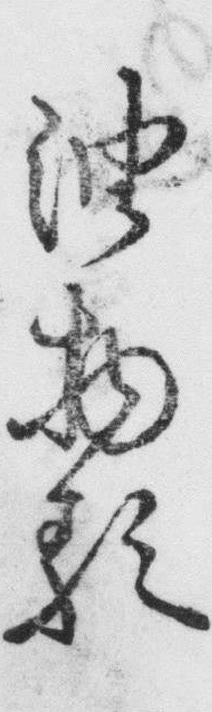油物類
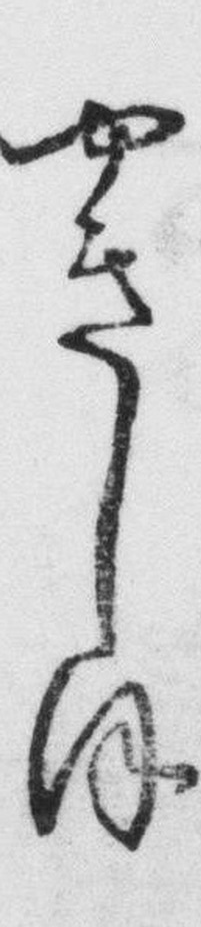やきしほ
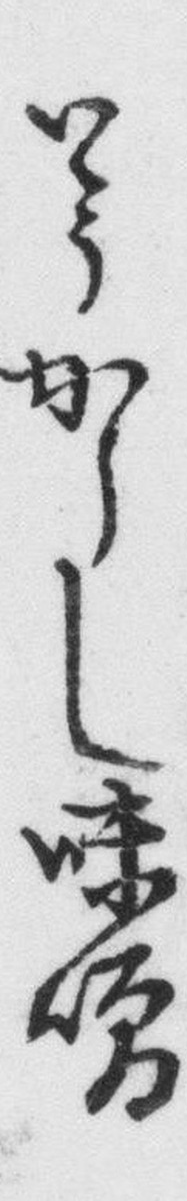とうからし味噌
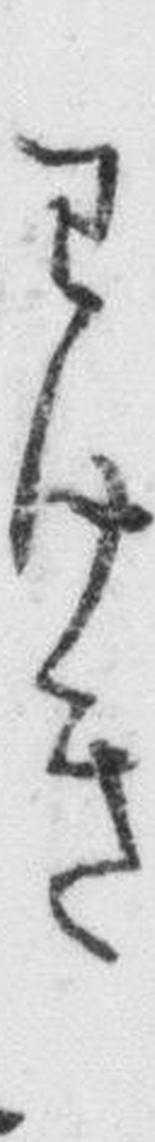わけき
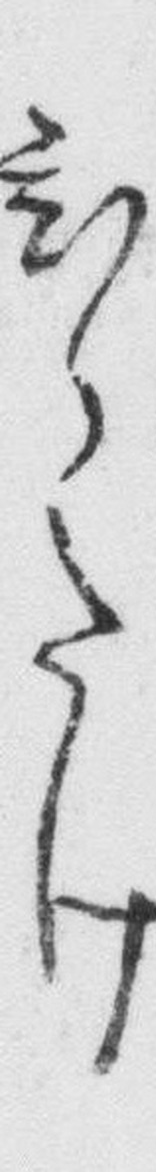飛らたけ
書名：普茶料理抄
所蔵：大阪府立大学学術情報センター 国文学研究資料館
